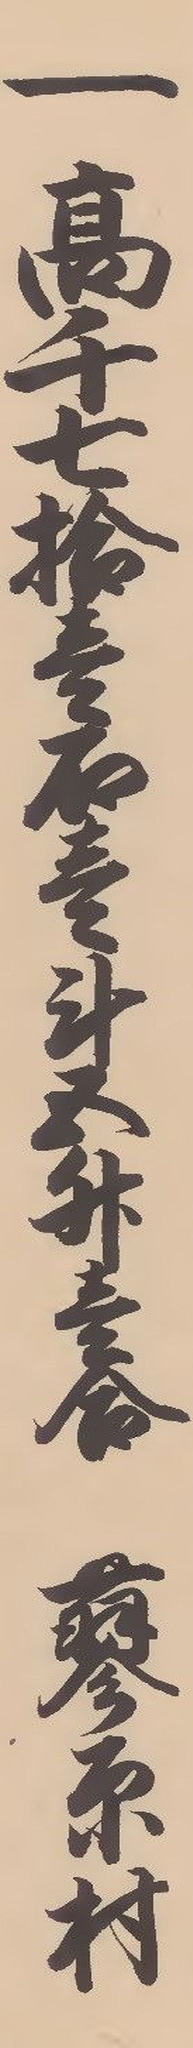一高千七拾壱石壱斗五升壱合蓼原村

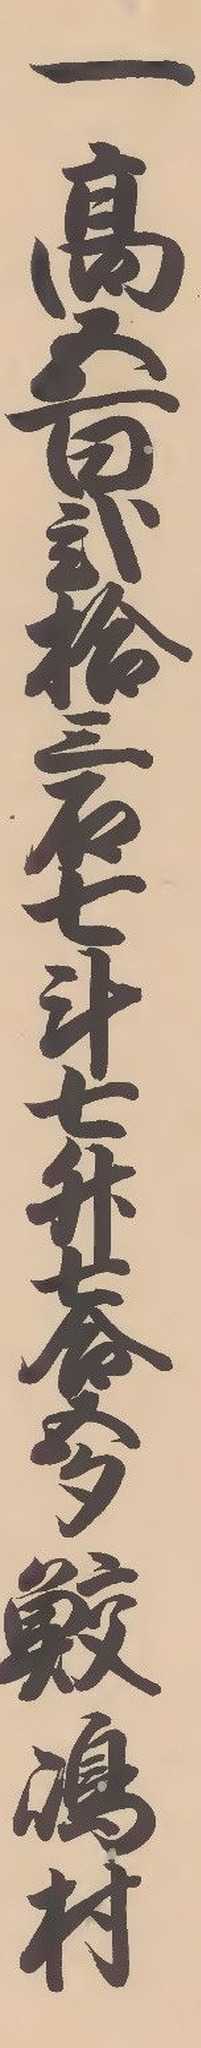一高五百弐拾三石七斗七升七合五勺鮫島村
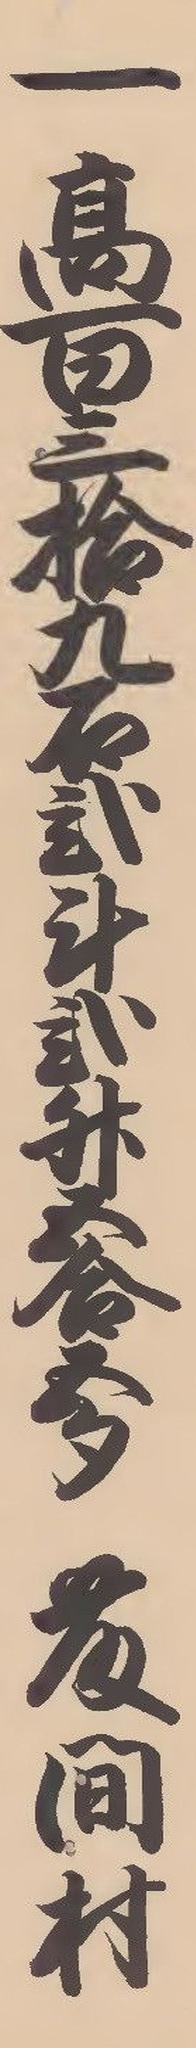一高百三拾九石弐斗弐升五合五勺藤間村
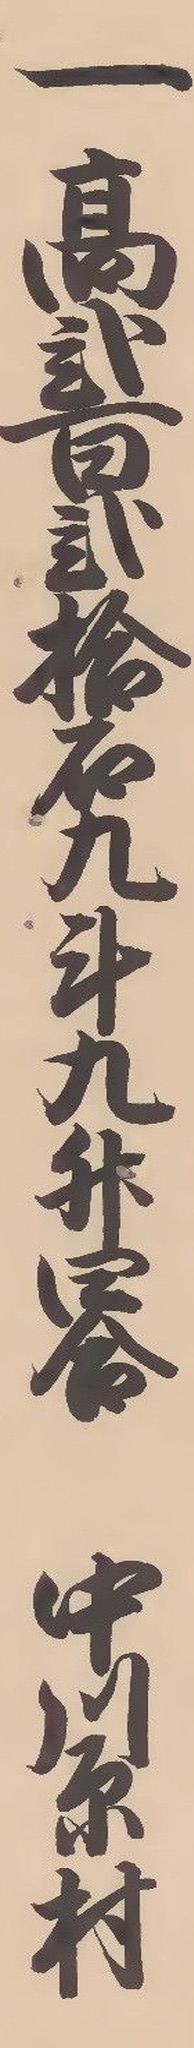一高弐百弐拾石九斗九升四合中川原村

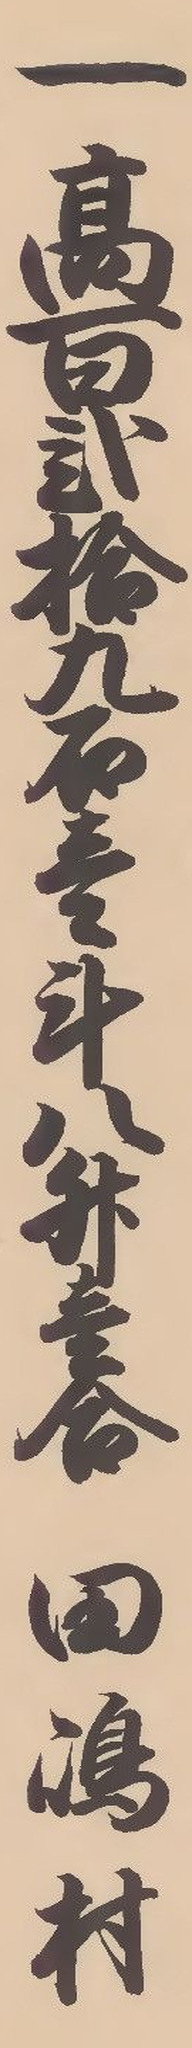一高百弐拾九石壱斗八升壱合田島村
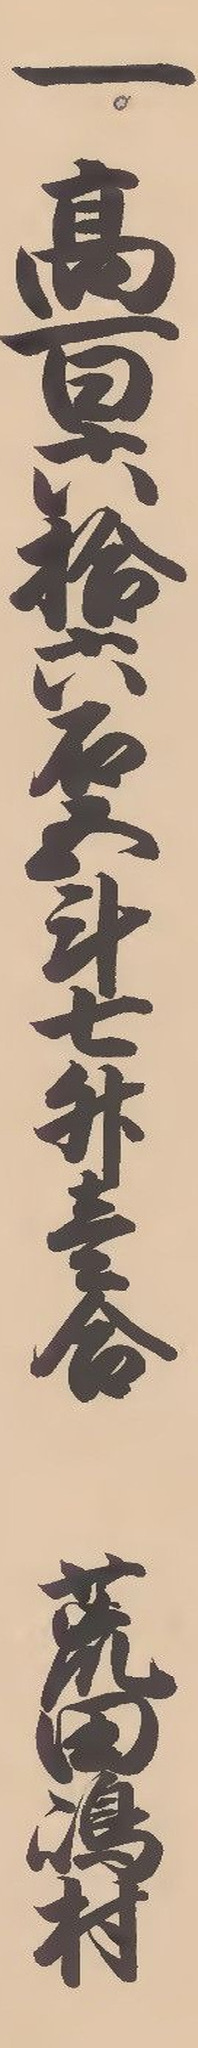一高百六拾六石五斗七升壱合荒田島村
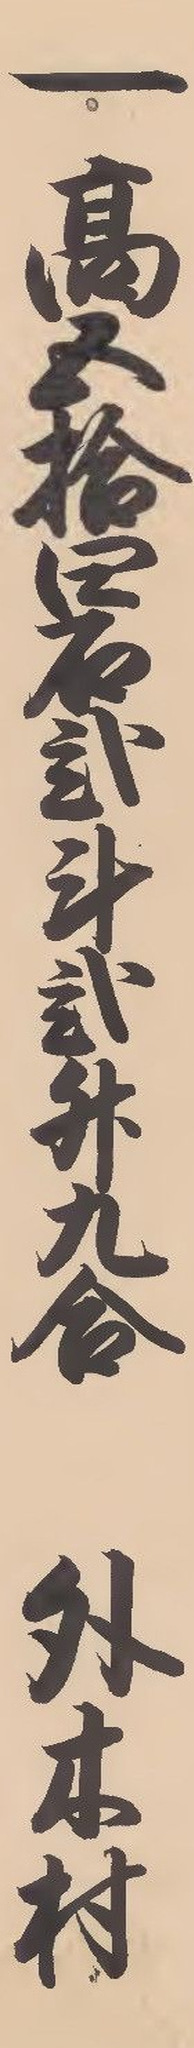一高五拾四石弐斗弐升九合外木村
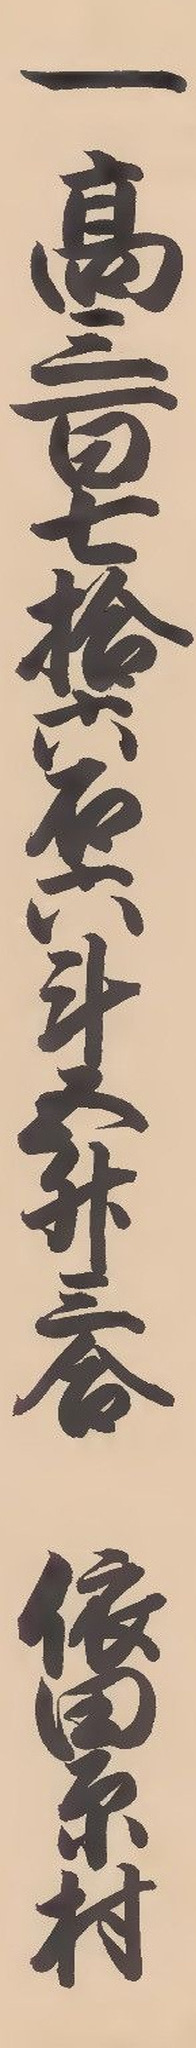一高三百七拾六石六斗五升三合依田原村
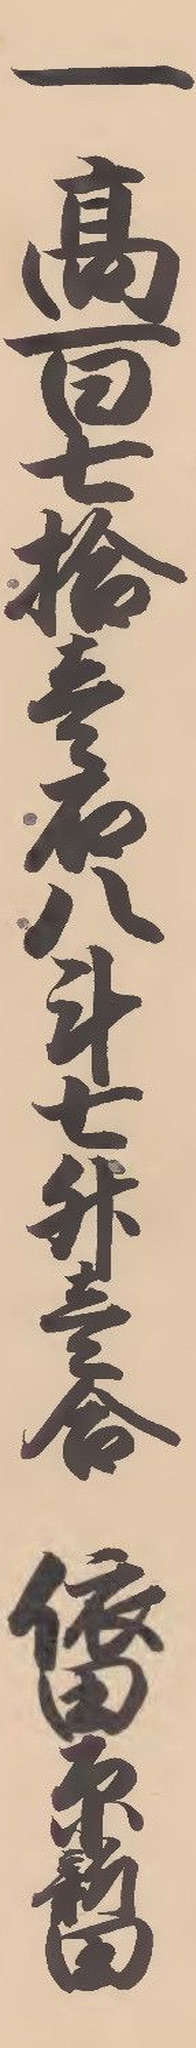一高百七拾壱石八斗七升壱合依田原新田

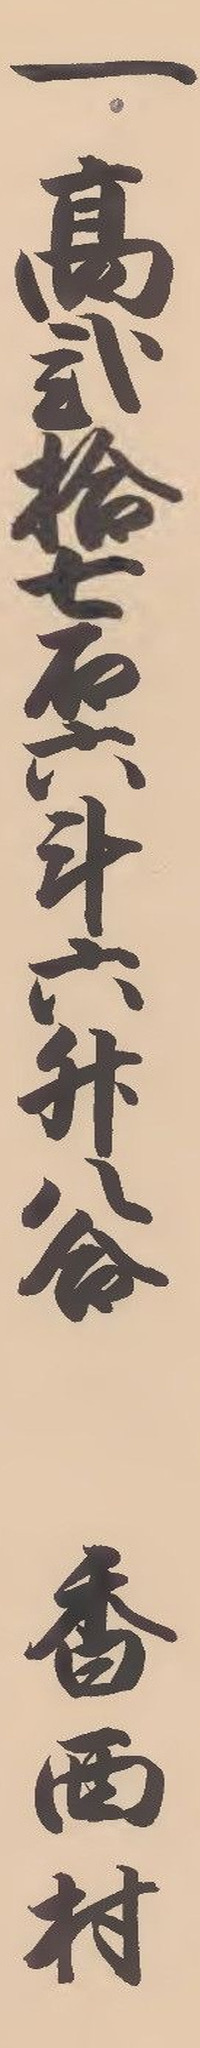一高弐拾七石六斗六升八合香西村
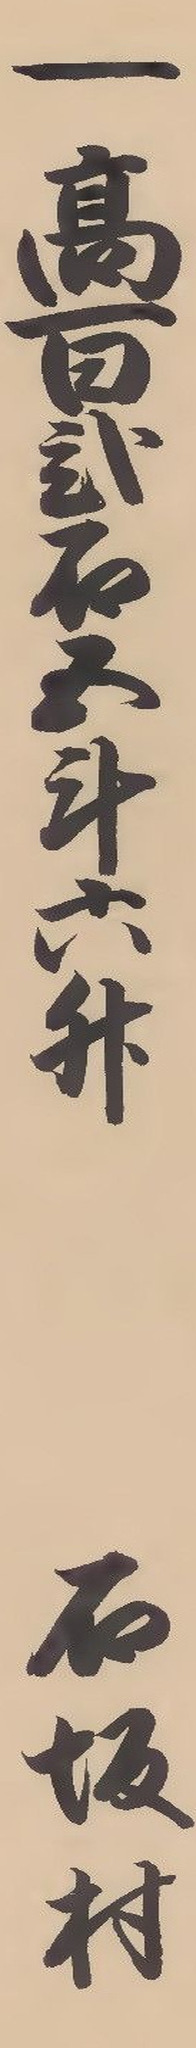一高百弐石五斗六升石坂村
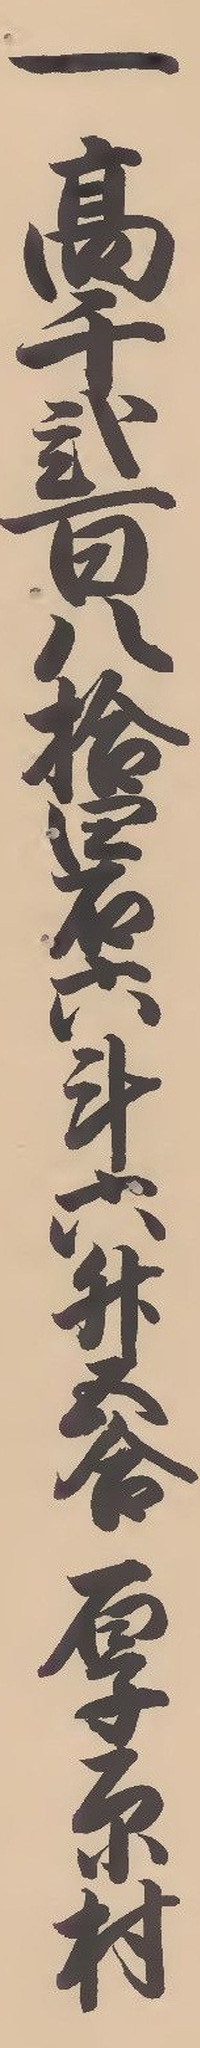一高千弐百八拾四石六斗六升五合厚原村

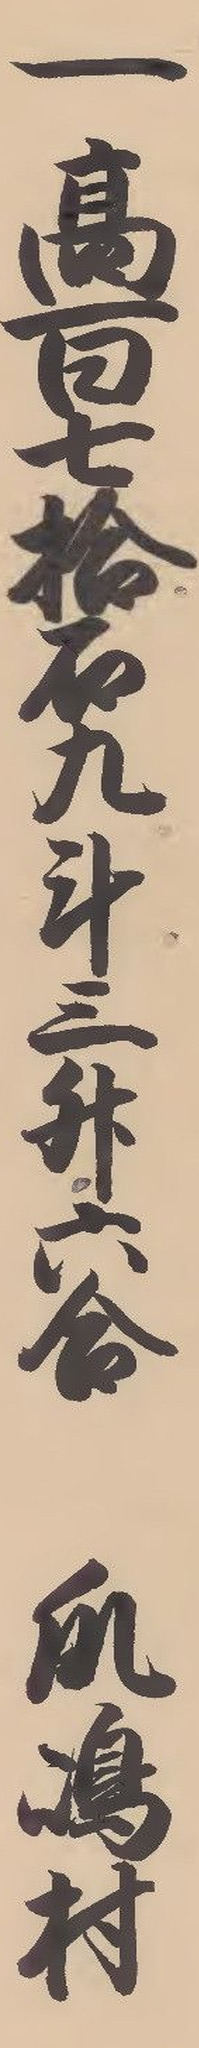一高百七拾石九斗三升六合瓜島村
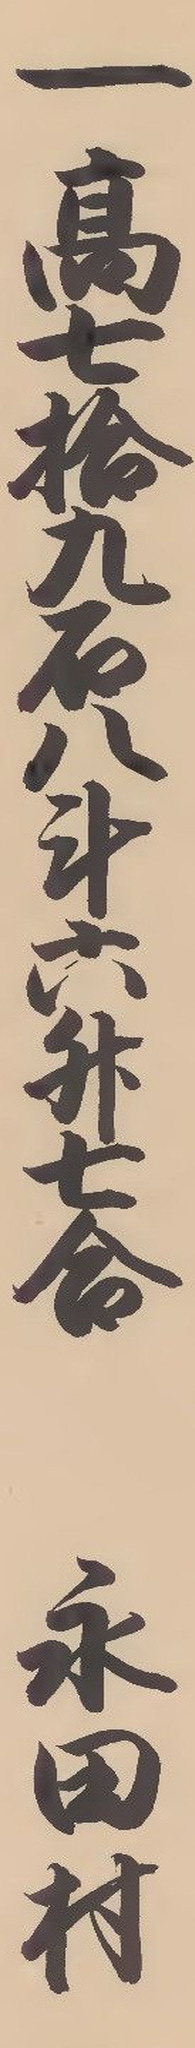一高七拾九石八斗六升七合永田村
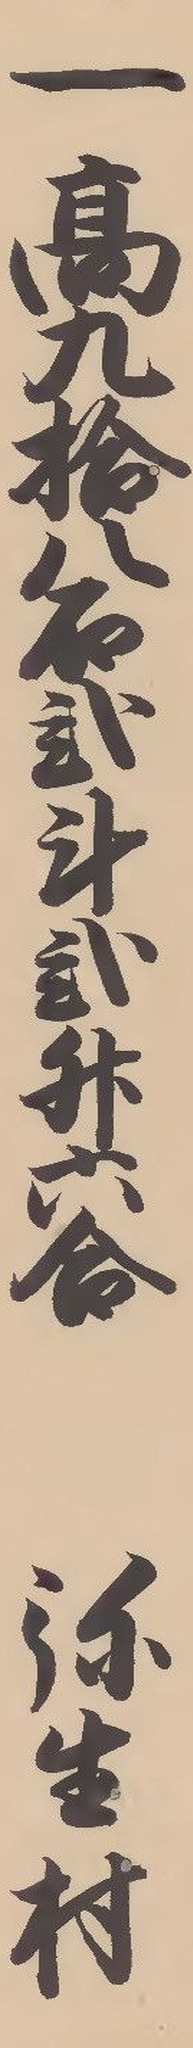一高九拾八石弐斗弐升六合弥生村
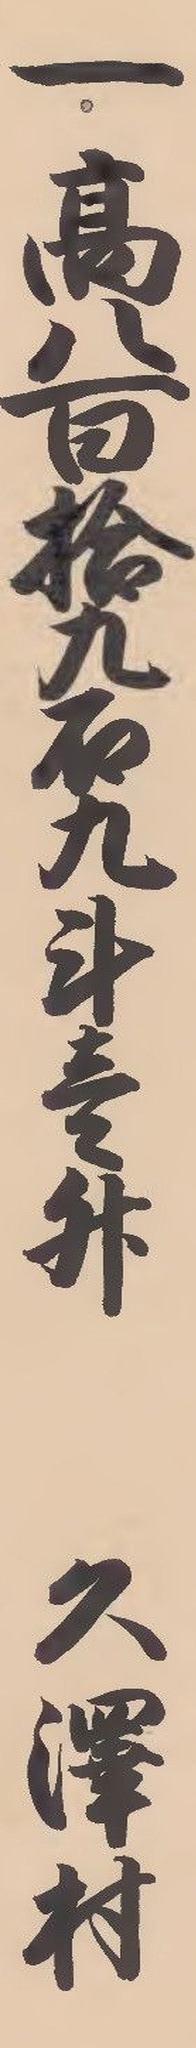一高八百拾九石九斗壱升久沢村
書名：駿河国郷帳
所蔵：国立公文書館 National Archives of Japan
